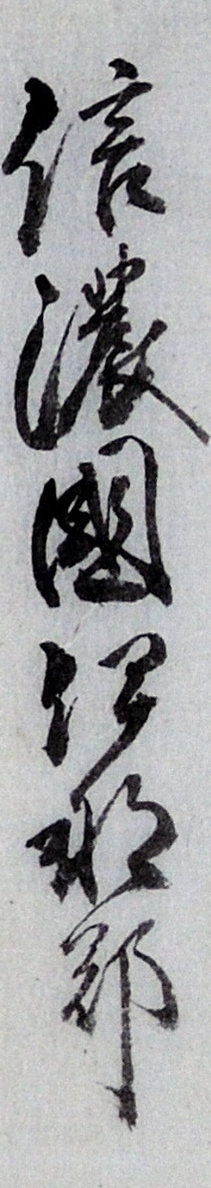信濃国伊那郡
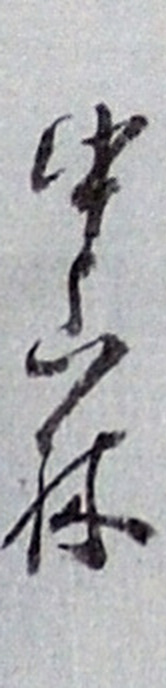中山林
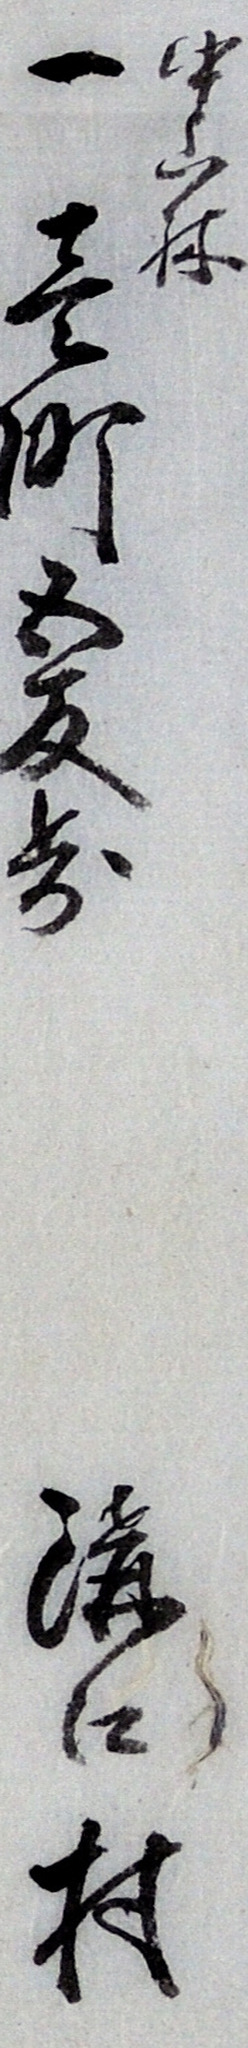一壱町五反歩溝口村
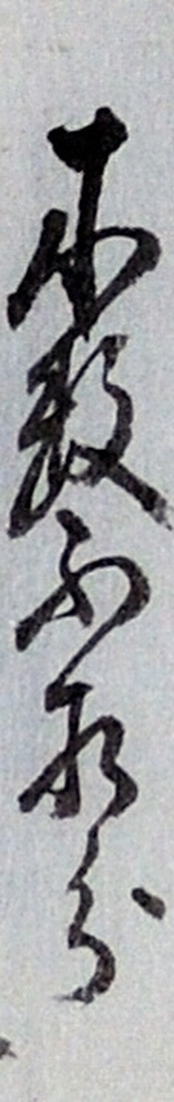木数不相分
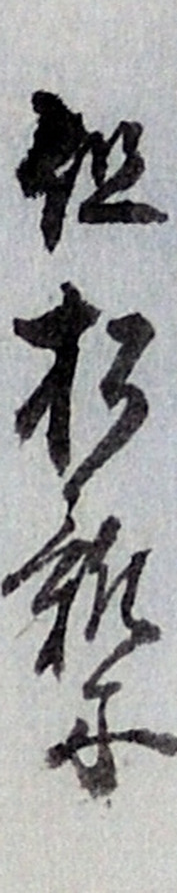但松雑木
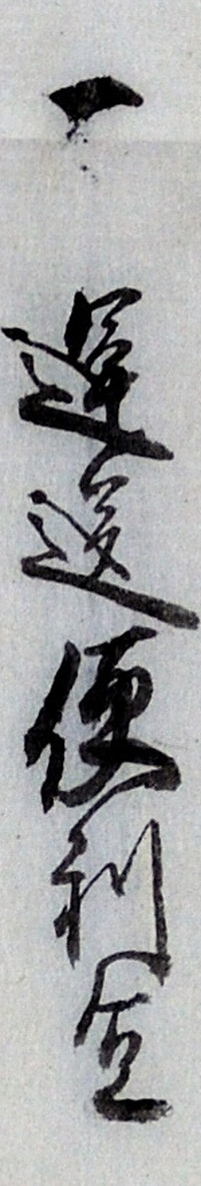一運送便利宜
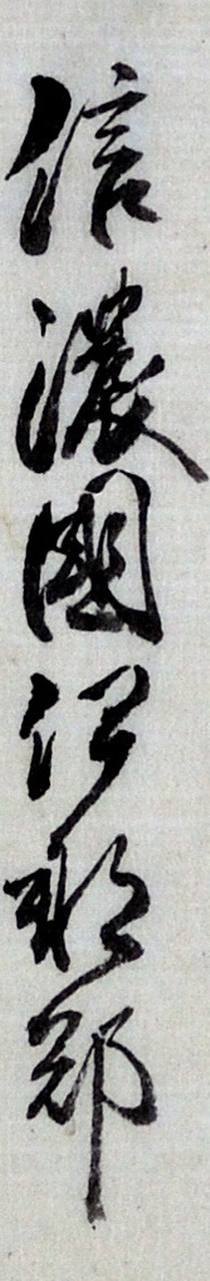信濃国伊那郡
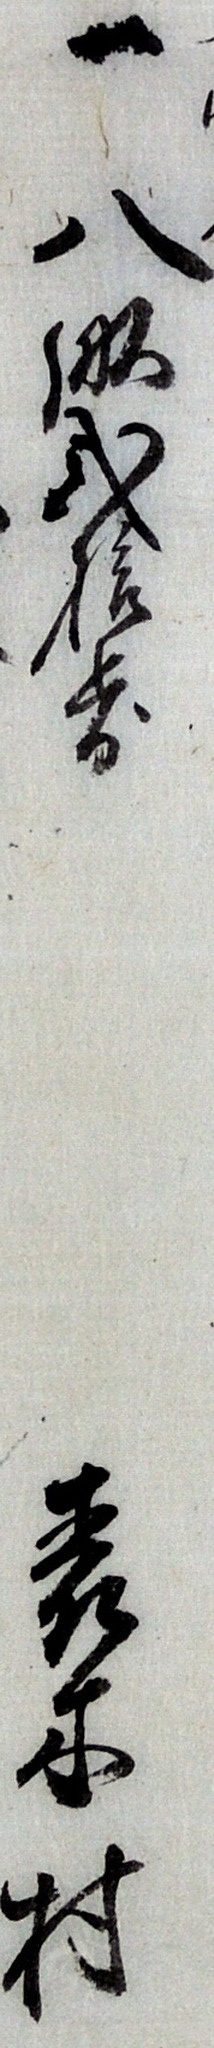一八㽗弐拾歩表木村
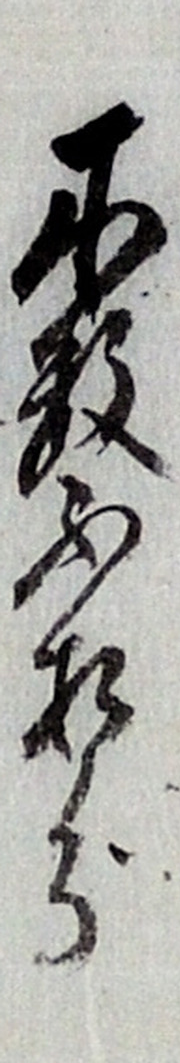木数不相分
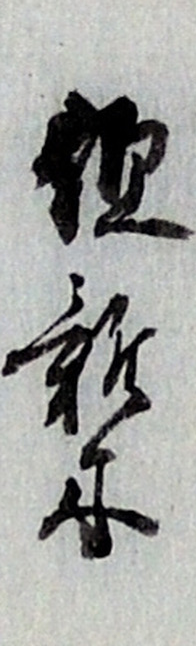但雑木
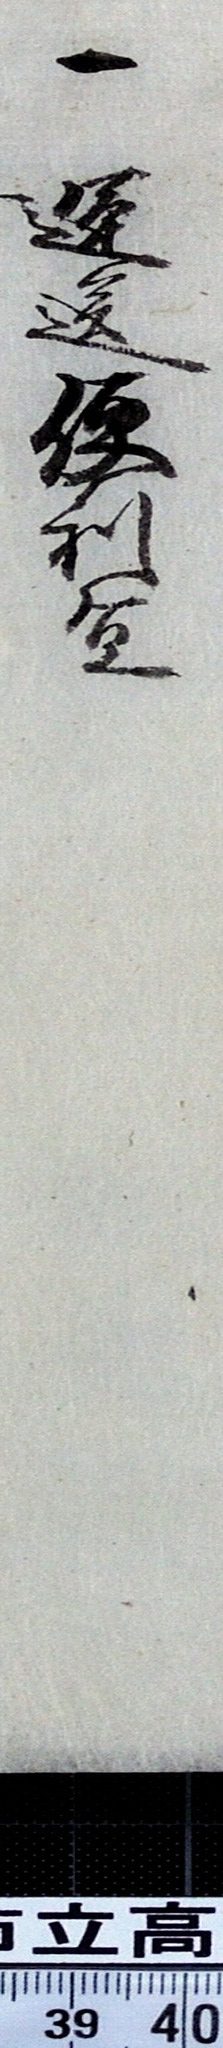一運送便利宜
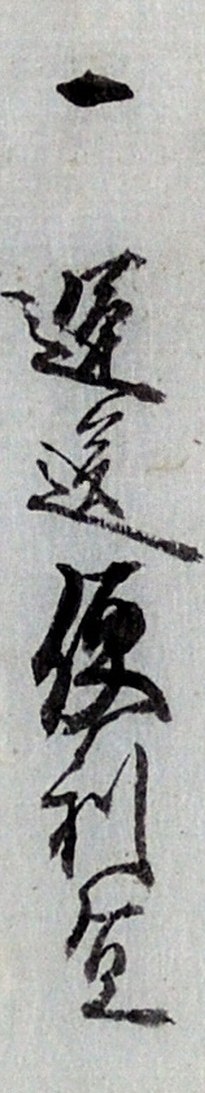一運送便利宜
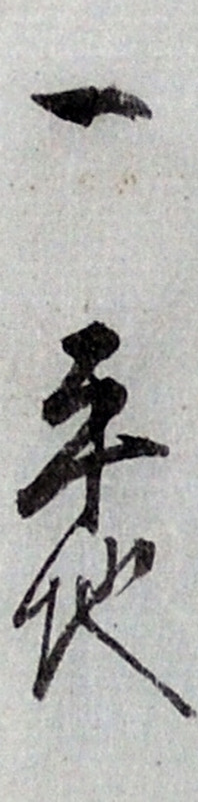一平地

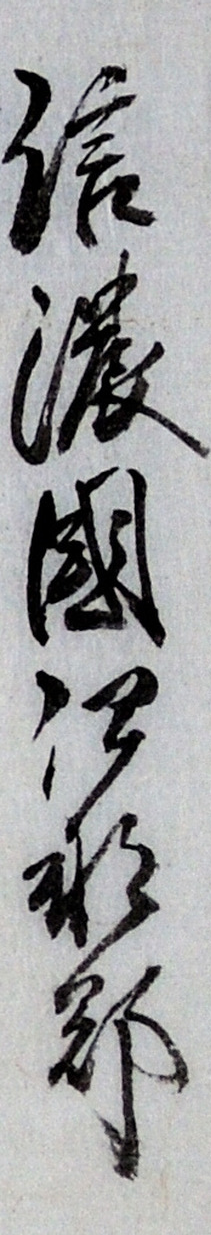信濃国伊那郡
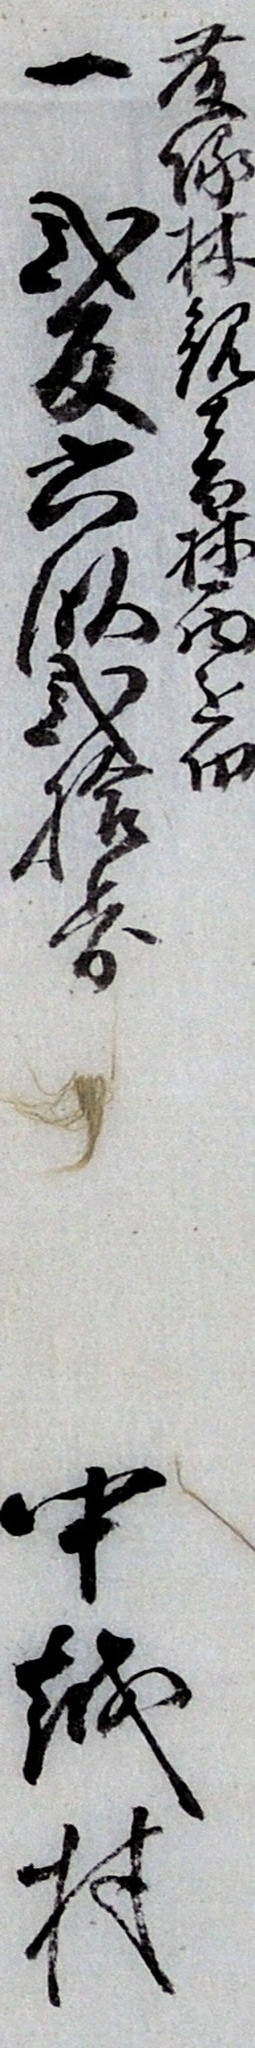一弐反六㽗弐拾歩中越村
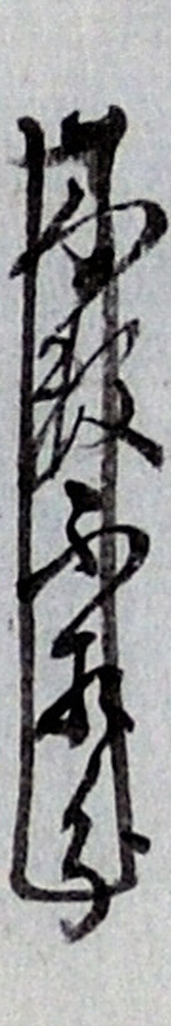木数不相分
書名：官林反別帳
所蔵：伊那市立高遠町図書館・合同会社AMANE
